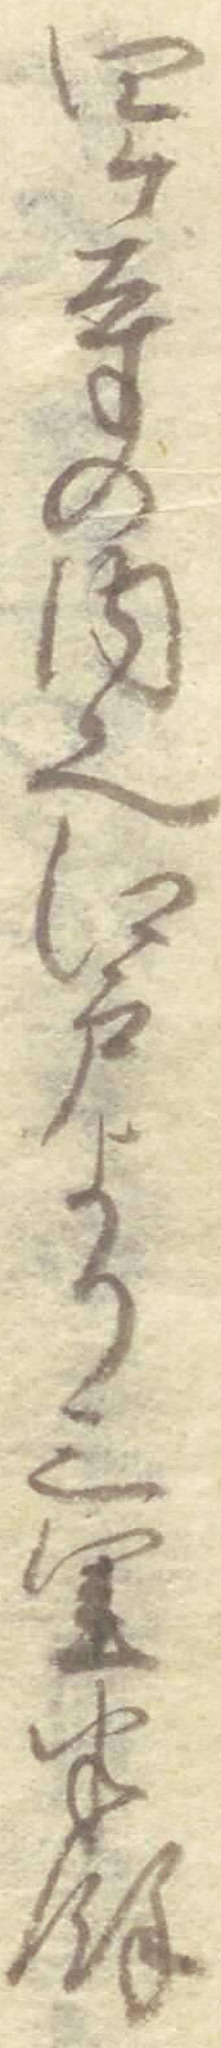四ケ寺の内也江戸より三里半余
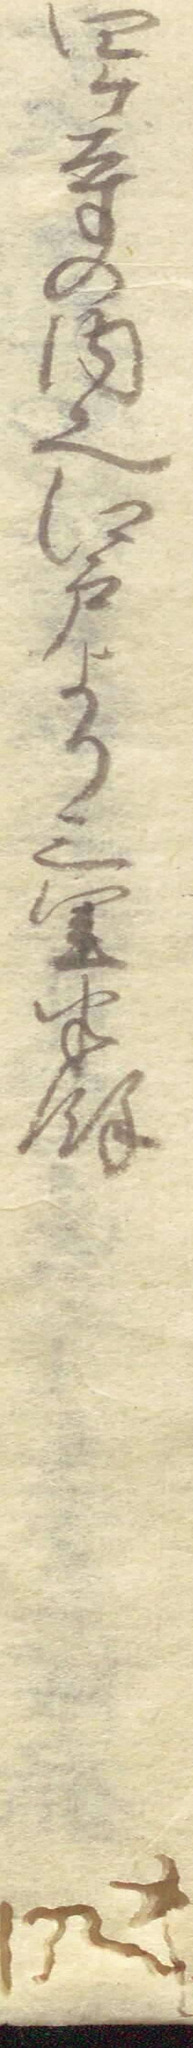四ケ寺の内也江戸より三里半余
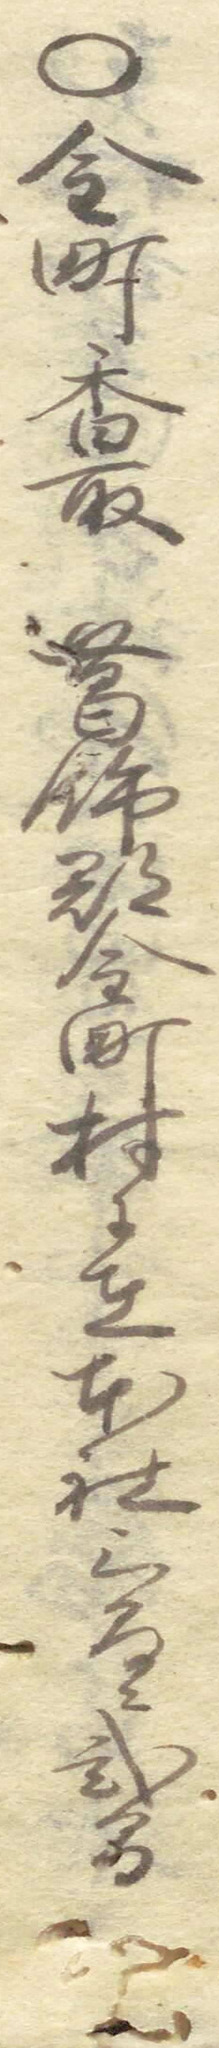○金町香取葛飾郡金町村に在本社三間に弐間
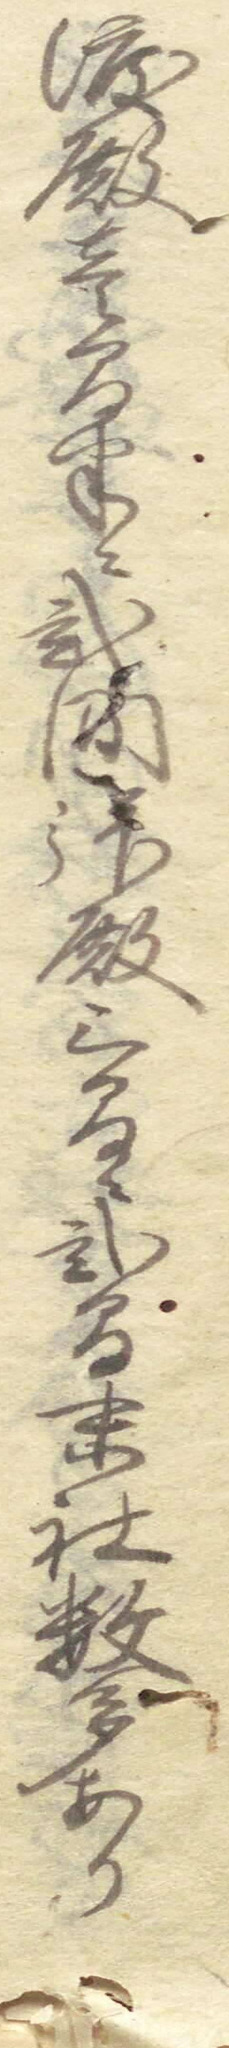渡殿壱間半に弐間拝殿三間に弐間末社数多あり
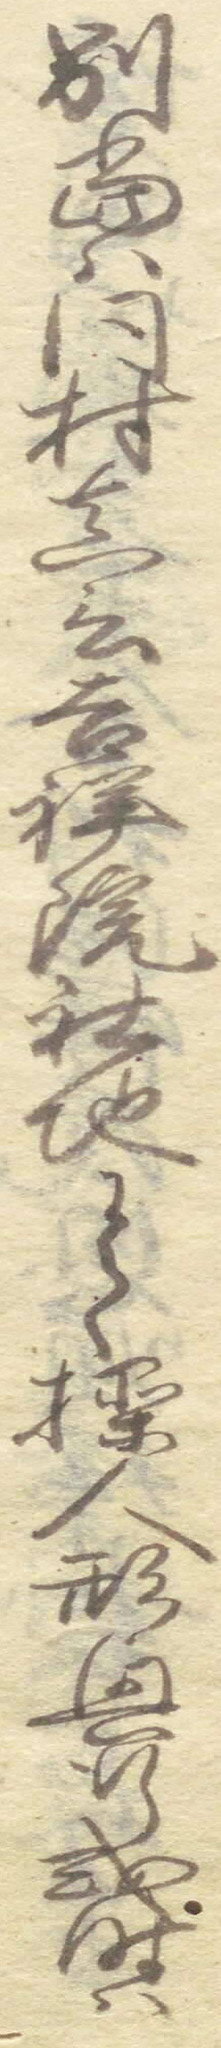別当は同村真言吉祥院社地にて操人形興行或時は
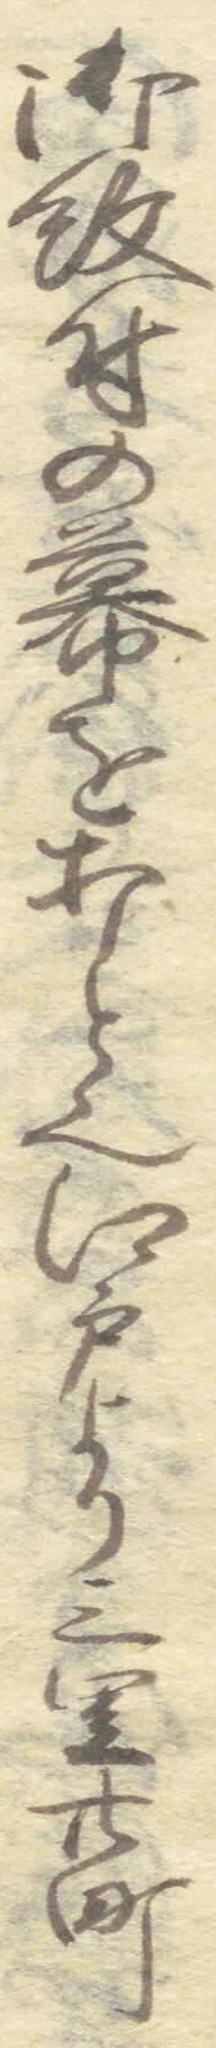御紋付の幕を打と也江戸より三里廿町
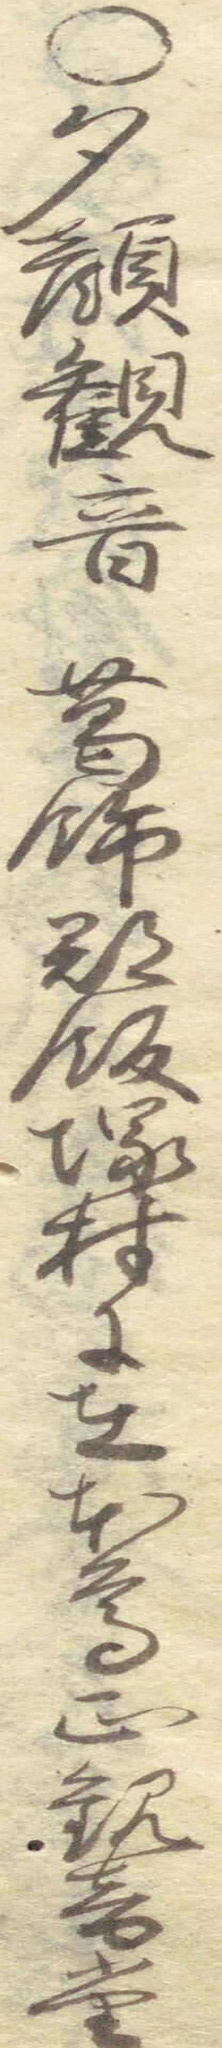○夕顔観音葛飾郡飯塚村に在本尊正観音堂
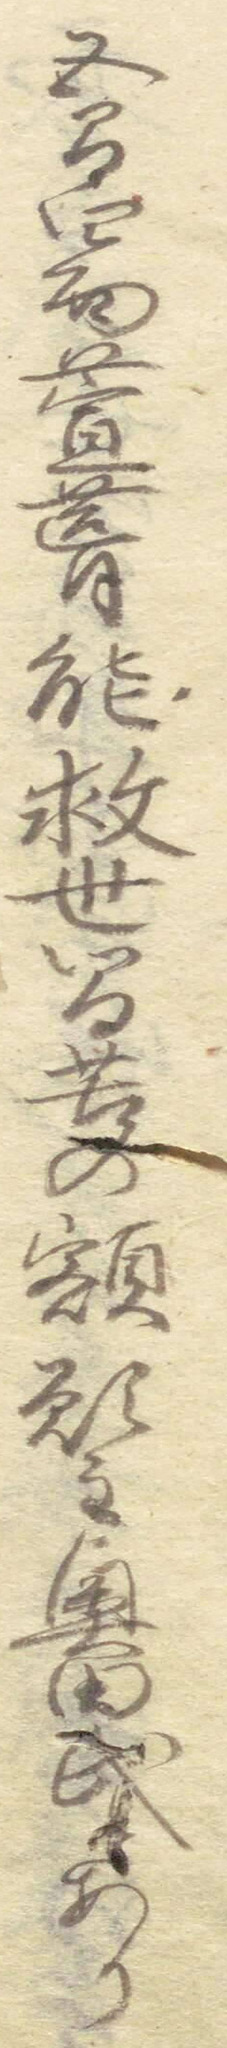五間四面萱葺能救世間苦の額願主奥田氏とあり
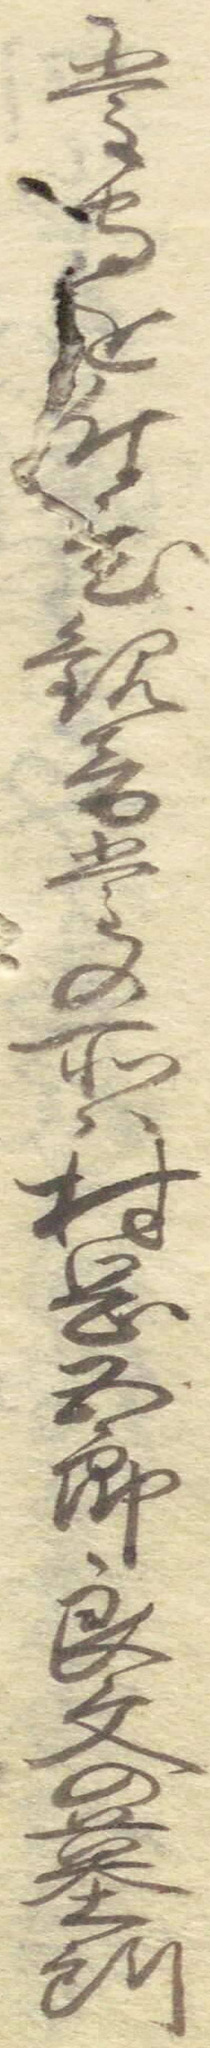堂守を付置観音堂の所は村岡五郎良文の墓所
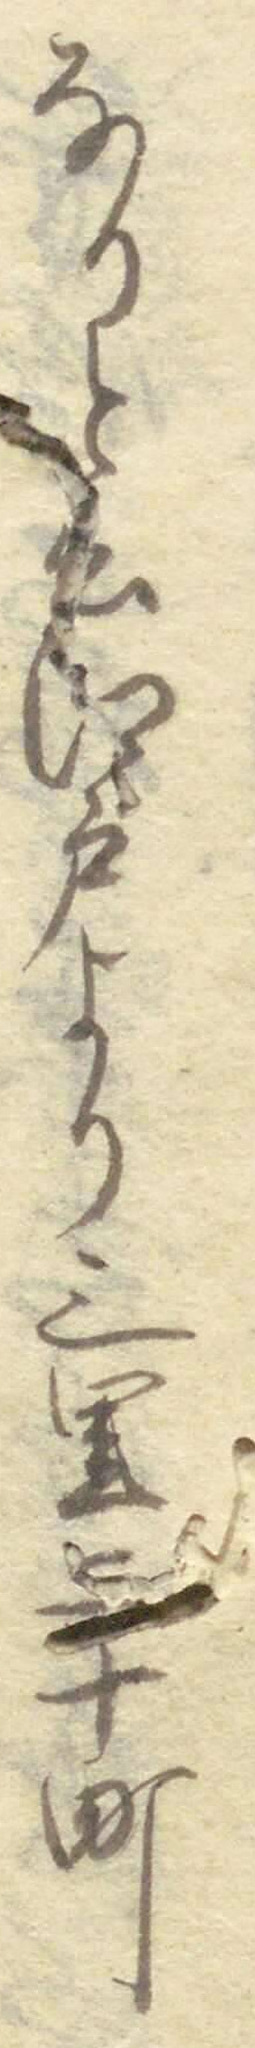なりと云江戸より三里三十町

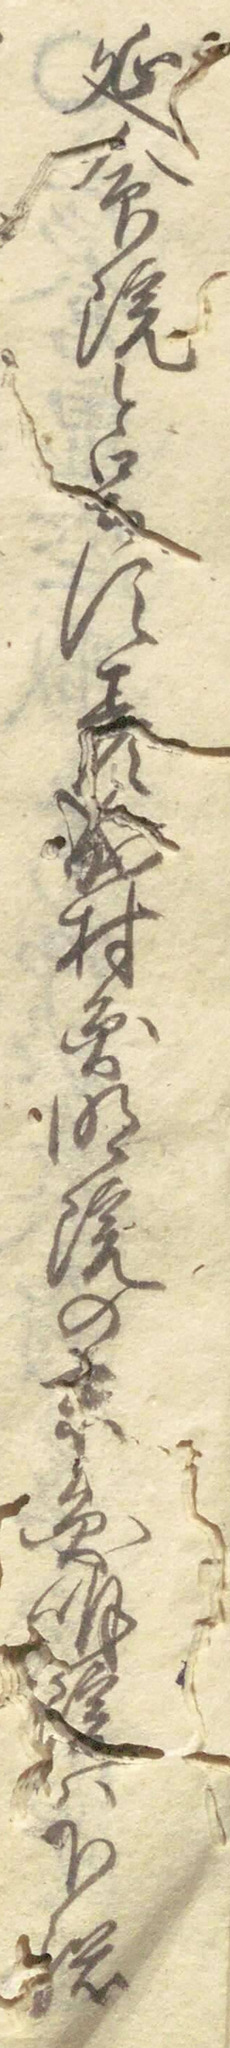延命院と号す彦成村円明院の末延命院は下総
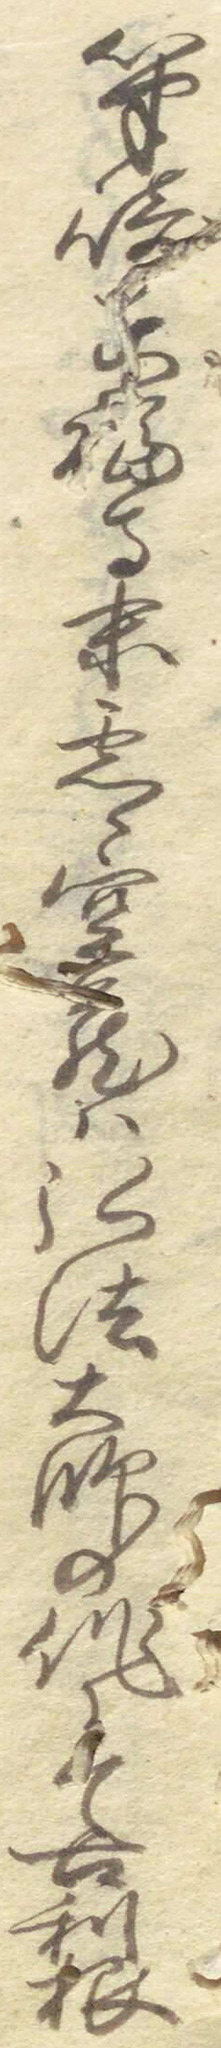筆崎東福寺末にして空蔵は弘法大師の作にて古利根
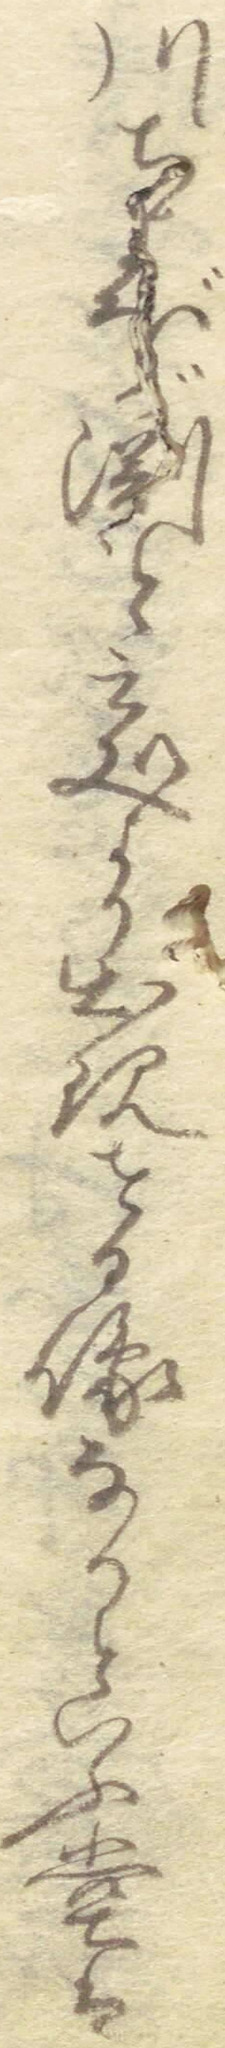川ちよぼが淵と云処より出現せる像なりといふ堂は
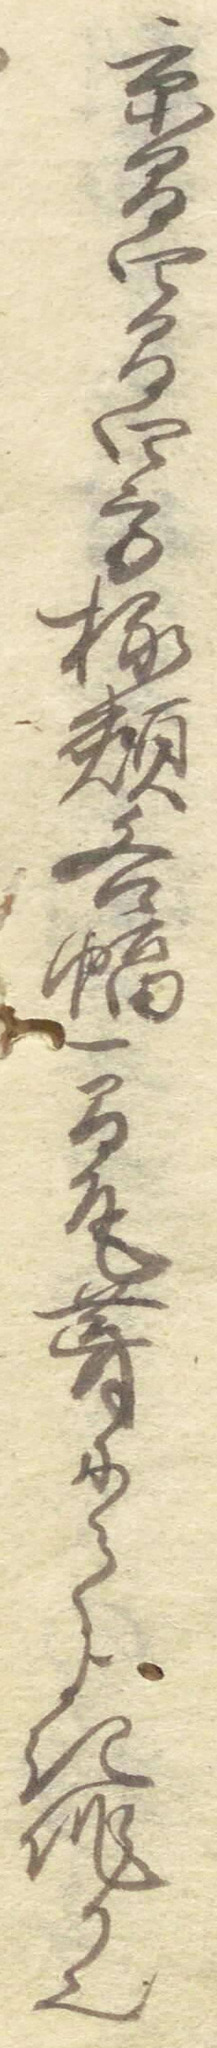京間四間四方椽頬各幅一間瓦葺にてよき作り也
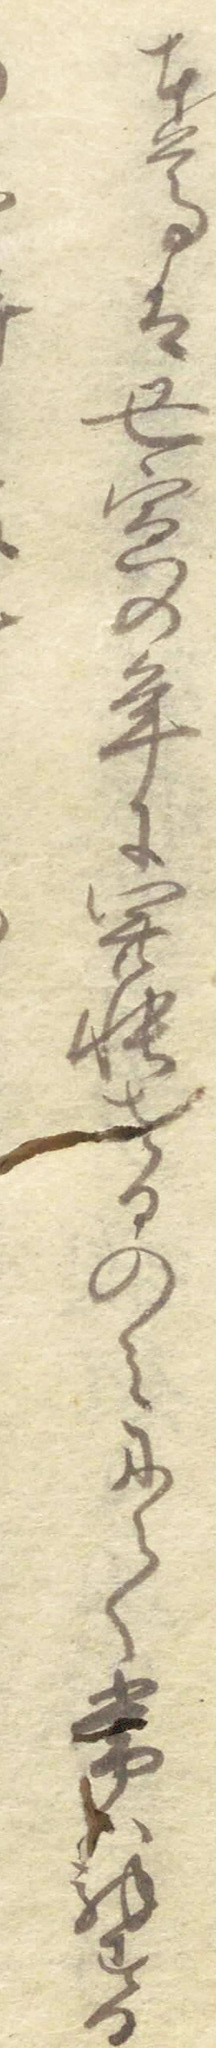本尊は丑寅の年に開帳するのみにて常は拝する
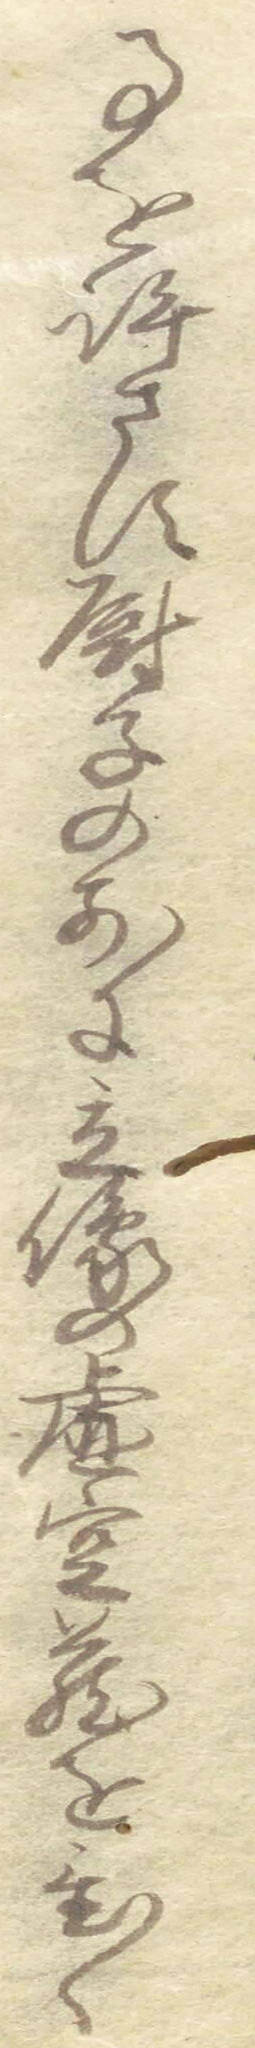事を許さす厨子の前に立像の虚空蔵を置く
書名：四神社閣記
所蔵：茨城大学附属図書館 国文学研究資料館
